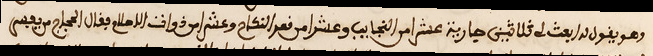وهو يقول له ابعث لى ثلاثين جارية عشرا من النجايب وعشرا من عقد النكاح وعشرا من ذوات الاحلام فقال الحجاج من يفسر
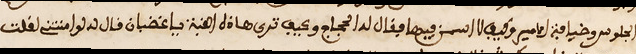الجلوس وضيافة الامير وكيف لا اسمن فيها فقال له الحجاج وكيف ترى هاذه القبة يا غضبان قال له لو امنتنى لقلت
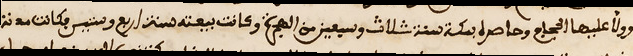وولا عليها الحجاج وحاصره بمكة سنة ثلاث وسبعين من الهجرة وكانت بيعته سنة اربع وستين فكانت مدته
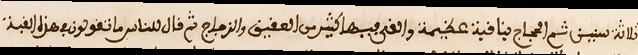ثالثة سنين ثم الحجاج بنا قبة عظيمة والقى فيها كثير من العقيق و الزجاج ثم قال للناس ما تقولون في هذه القبة
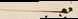قف
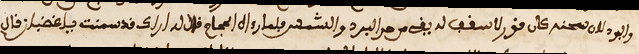والبرد لان سحنه كان قور لا سقف له يقى من حرا البرد والشمس فلما رءاه الحجاج قال له اراك قد سمنت يا غضبان قال
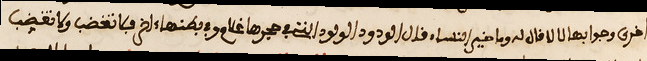اخرى وجوابها لا لا قال له خير النساء قال الودود الولود التي في حجرها غلام وفي بطنها ءاخر فلا تغضب ولا تغضب
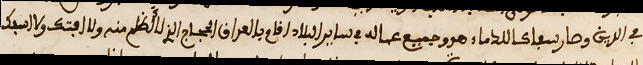في الدين وصار سفاكا للدماء هو وجميع عماله في ساير البلاد اقام بالعراق الحجاج الذي لا أظلم منه ولا افتك ولا اسفك
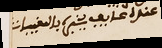عنده عايف يخبره بالمغيبا
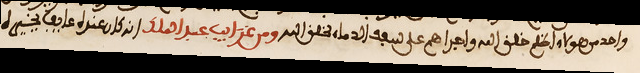واحد من هولاء اظلم خلق الله واجراهم على سفك الدماء لخلق الله ومن غرايب عبد الملك انه كان عنده عايف يخيره
